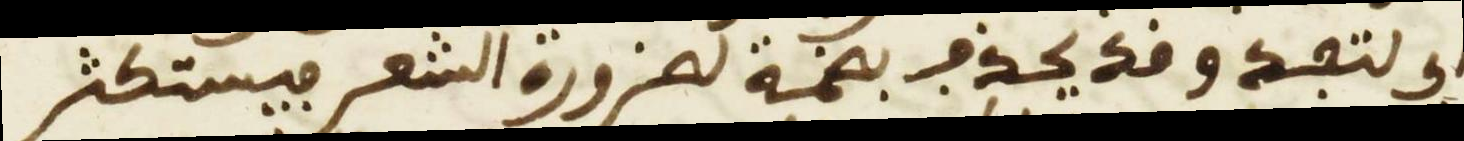أي لتجد وقد يحذف بضمة لضرورة الشعر فيستكثر
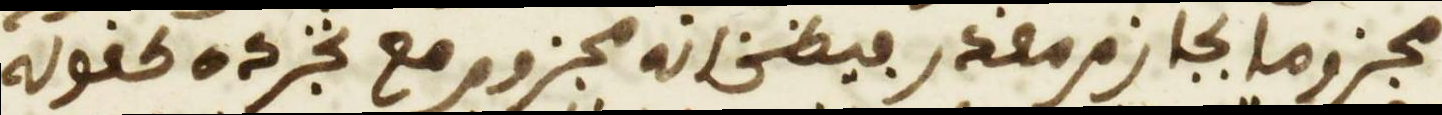مجزوما بجازم مقدر فيظن انه مجزوم مع تجرده كقوله
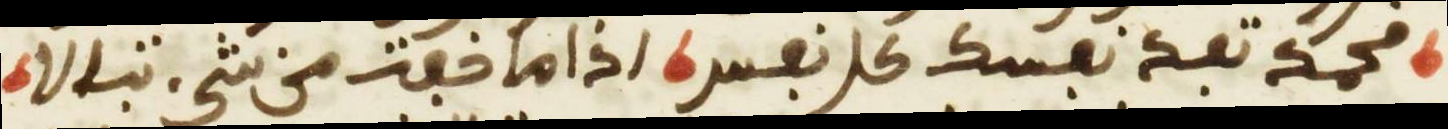، محمد تفد نفسك كل نفس، اذا ما خفت من كل شيء تبالا،
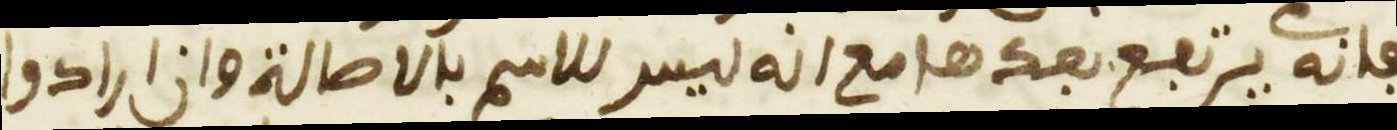فانه يرتفع بعدها مع انه ليس للاسم بالاصالة وان ارادوا
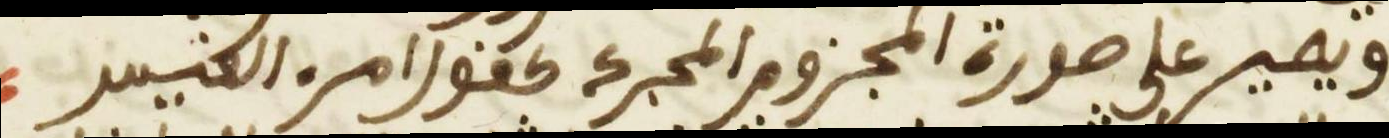ويصير على صورة المجزوم كقول امرء القيس
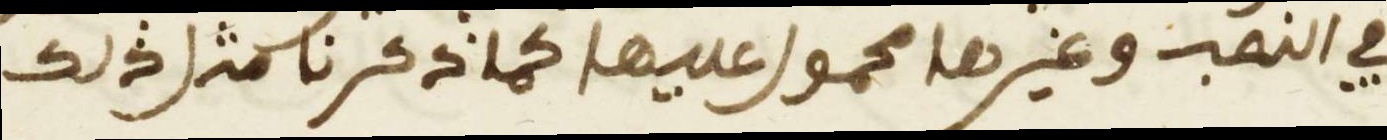في النصب وغيرها محمول عليها كما ذكرنا مثل ذلك
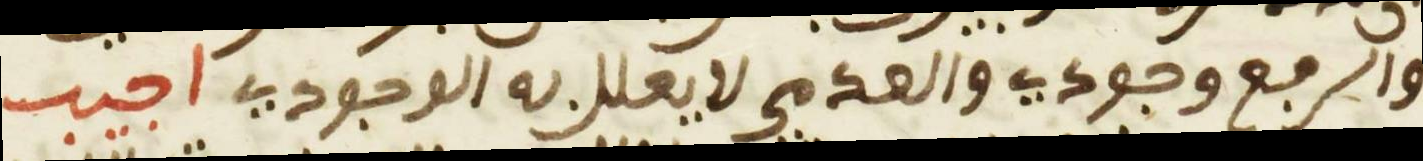والرفع وجودي والعدمي لا يعلل به الوجودي اجيب
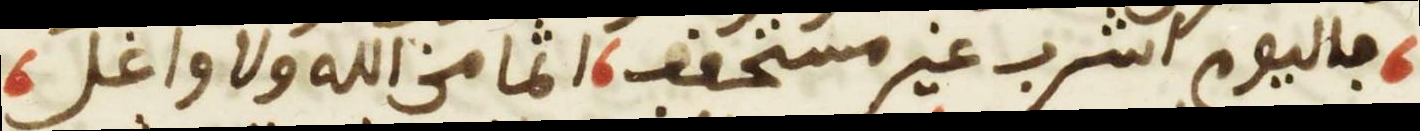فاليوم اشرب غيرمستحقب ، اثما من الله ولا وغل
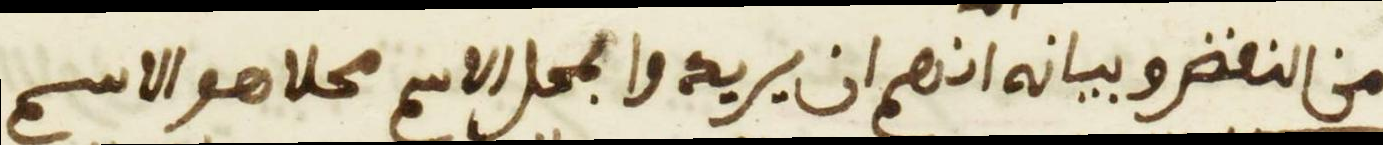من النقض وبيانه انهم ان يريدوا بمحل الاسم محلا هو الاسم
